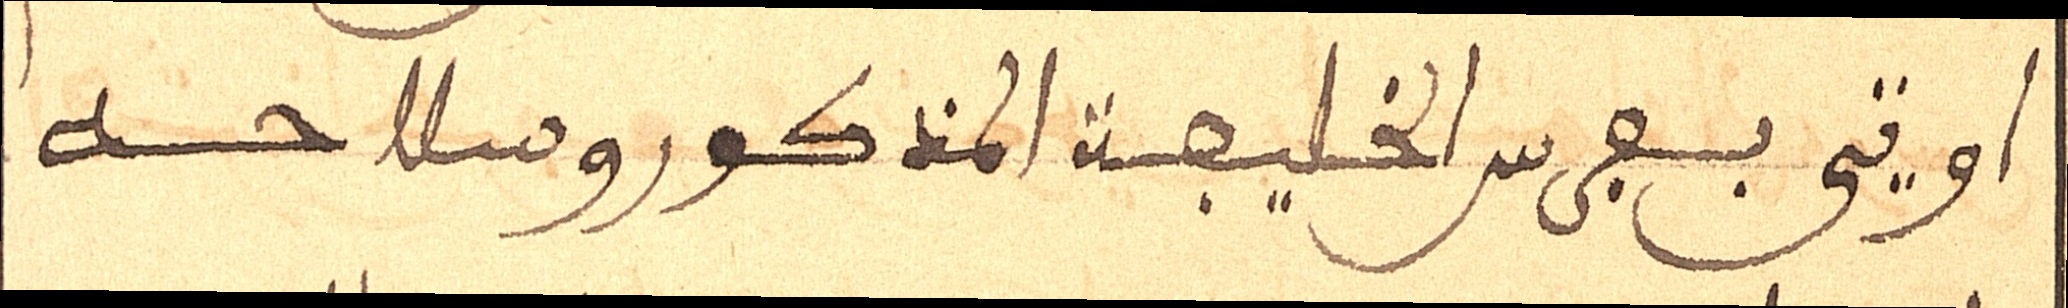اوتي بقرس الخليفة المذكور وسلاحه
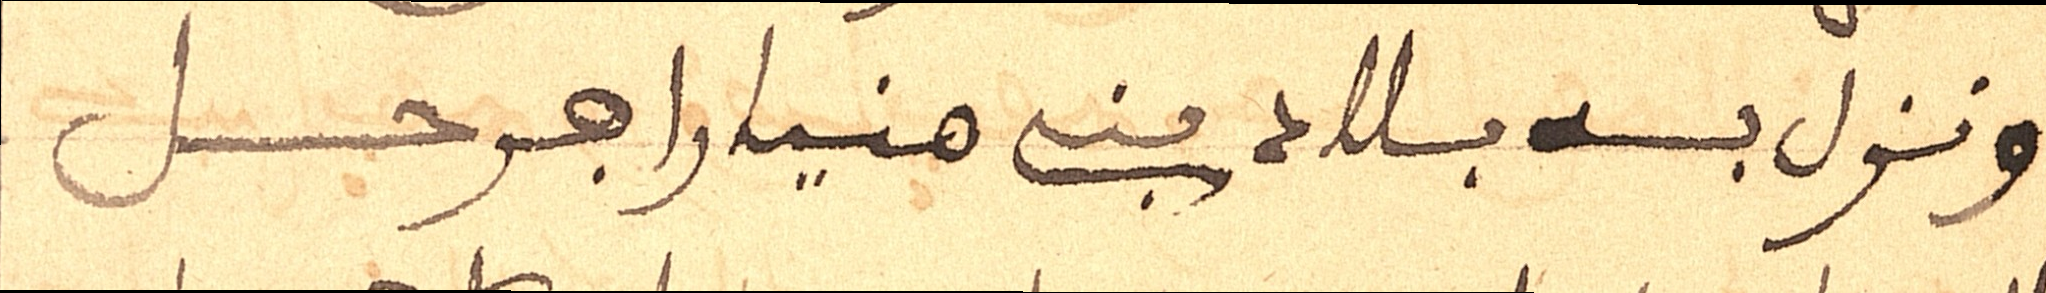ونزل به بلاد بنى منيارا فرحل
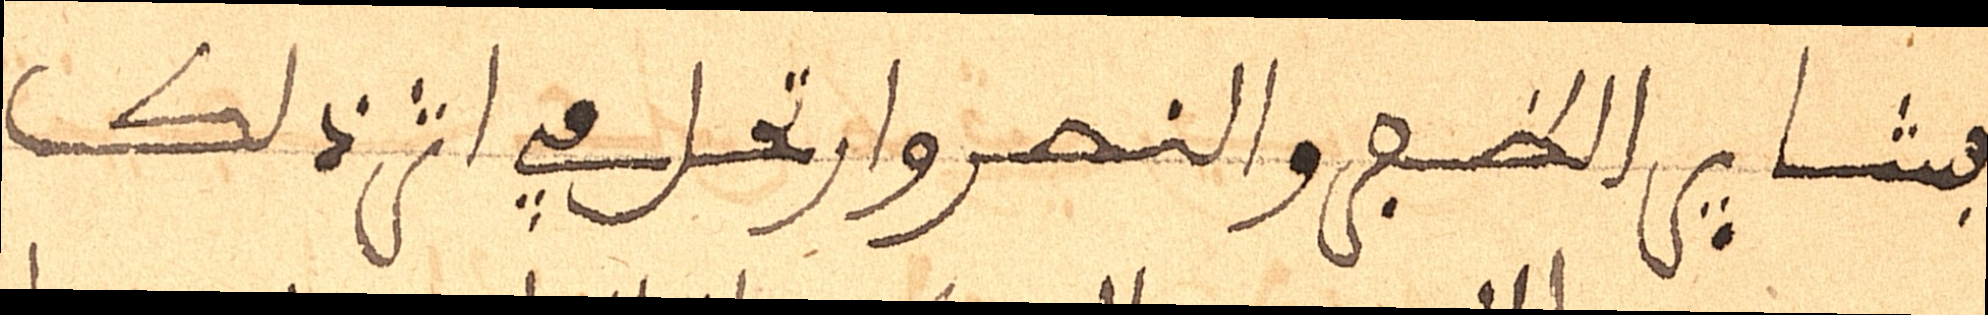بشائر الظفر والنصر وارتحل في اثر ذلك
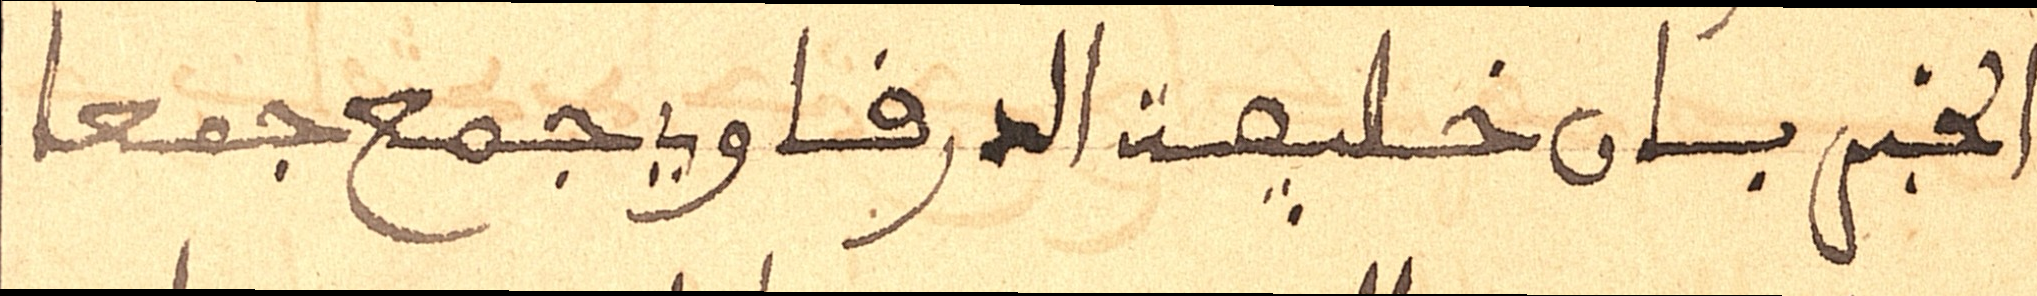الخبر بان خليفة الدرقاوي جمع جمعا
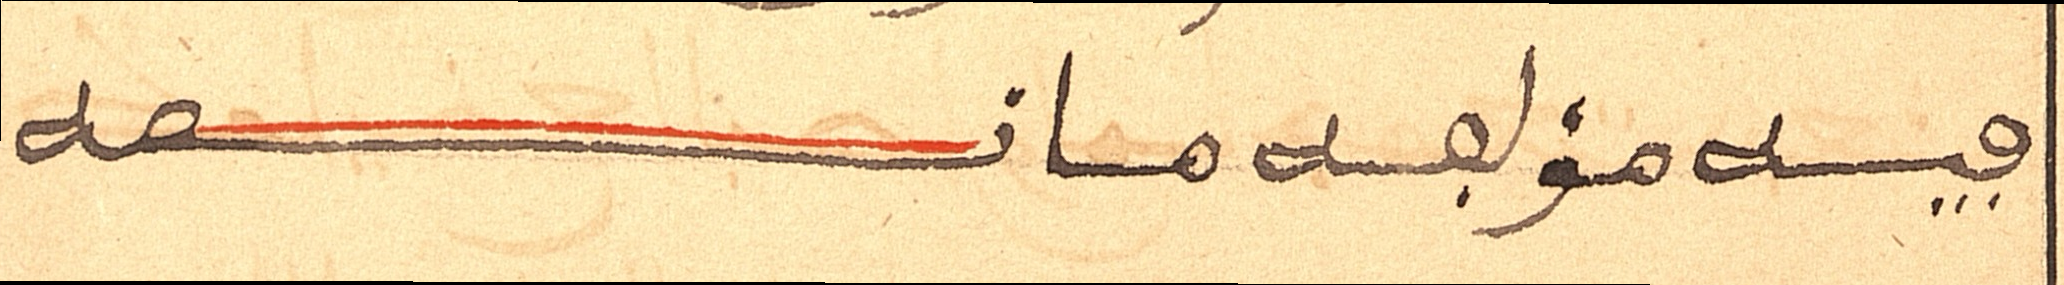فبه مؤلفه مانصه
